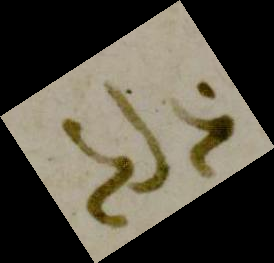ذلك
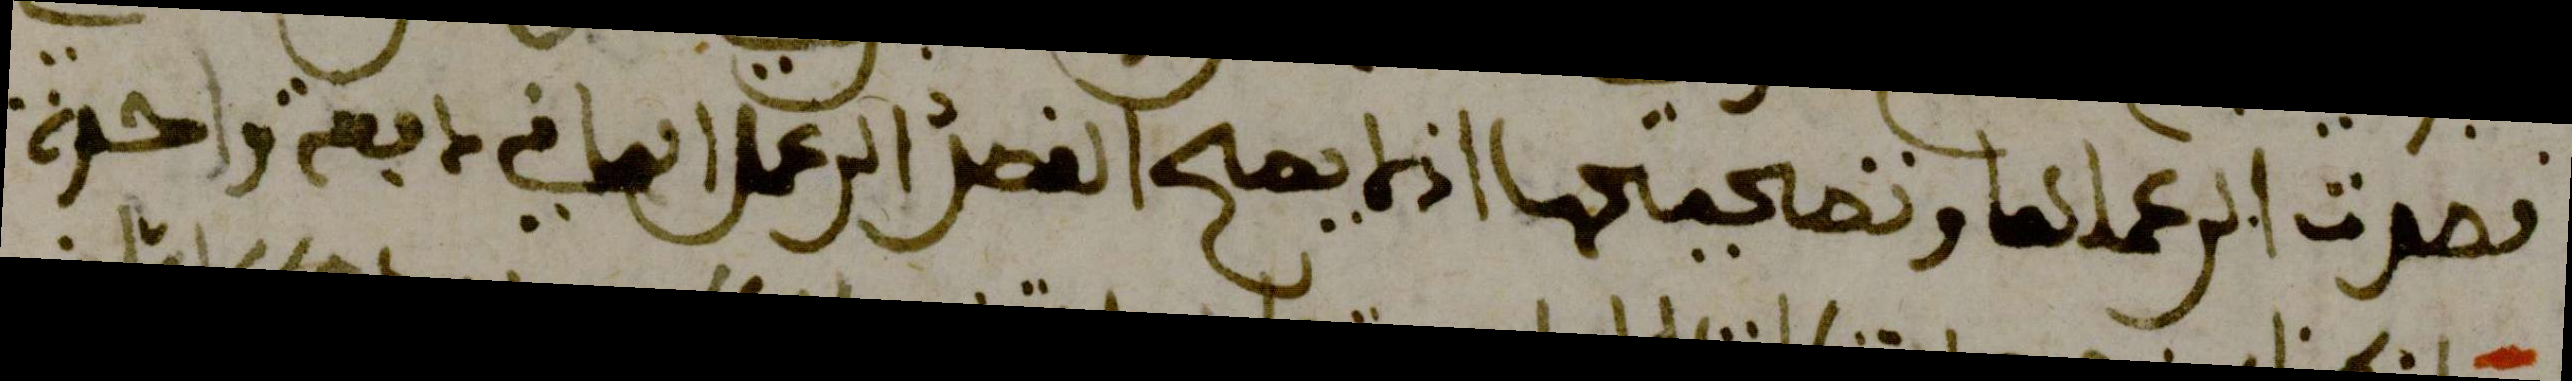قصدت الى عماها وتصحيحها اذ لا يصح القصد الى عمل الباقي دفعة واحدة
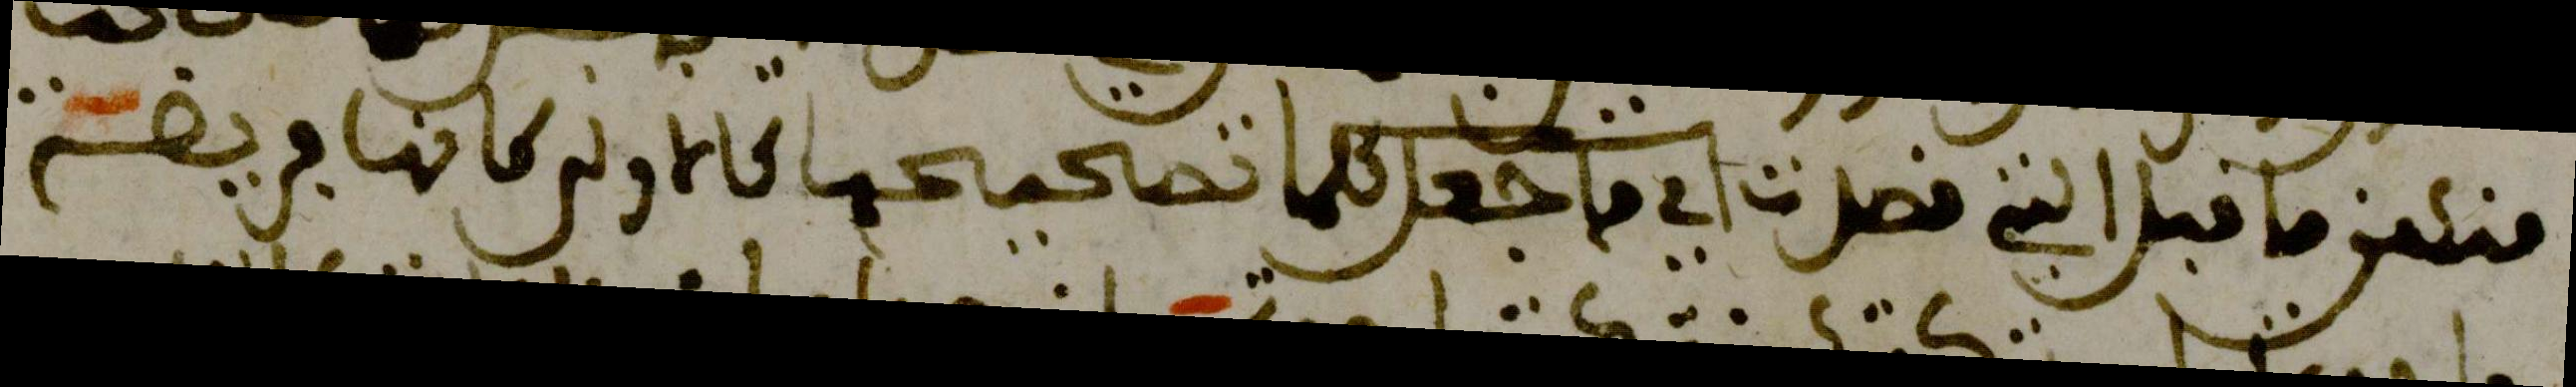منهن ما قبل التي قصدت اي ما جعل كلما تصحيحها كالاولى كانها فريضة
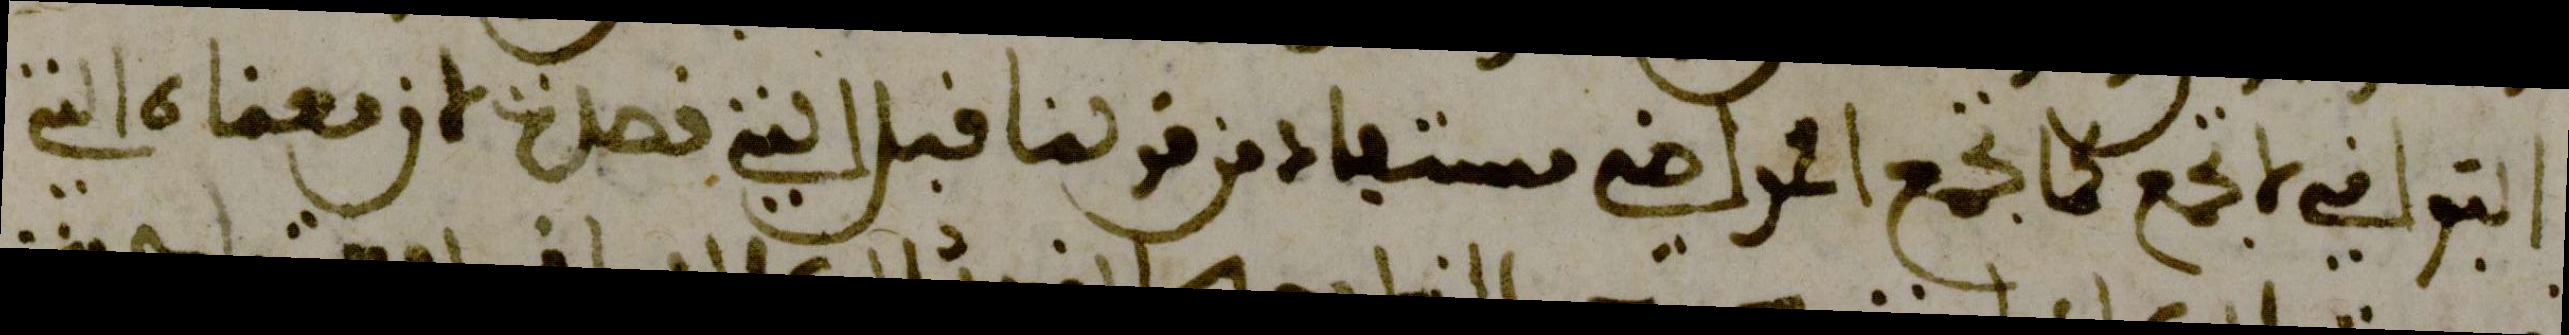البواقي لا تجمع كما تجمع المواضي مستفاد من قولنا قبل التي قصدت لان معناه التي
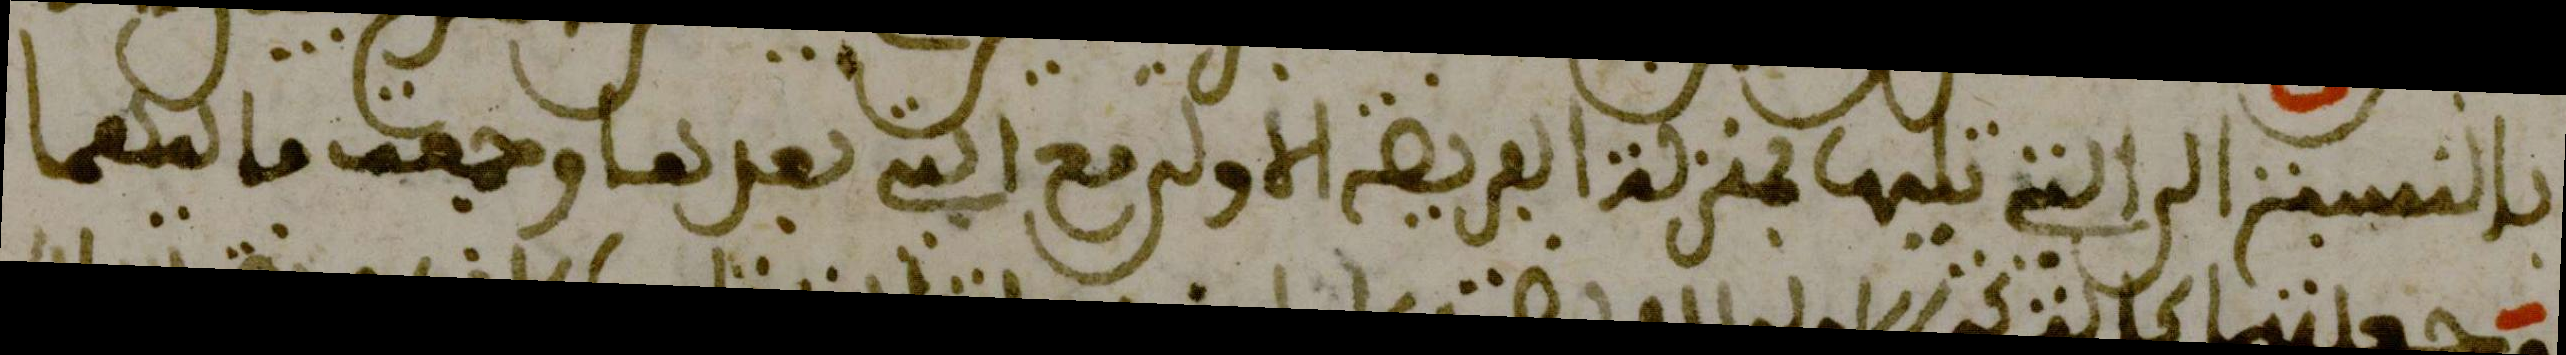بالنسبة الى التي تليها بمنزلة الفريضة الاولى مع التي بعدها وجمعت ماليها
